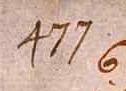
4776
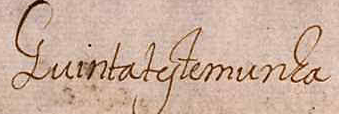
Quinta testemunha
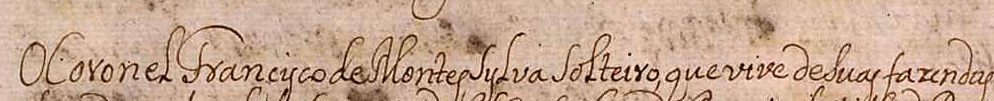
O Coronel Francisco de Montes Sylva Solteiro, que vive de Suas fazendas
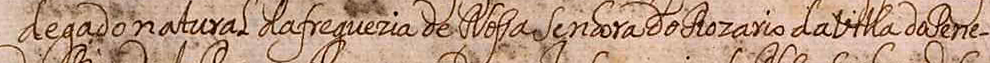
de gado natural da freguezia de Nossa Senhora do Rozario da villa do Pene
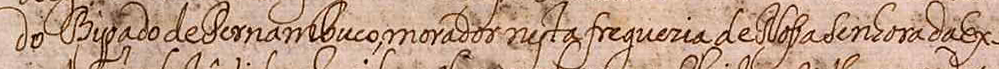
do Bispado de Pernambuco, morador nesta freguezia de Nossa Senhora da Ex
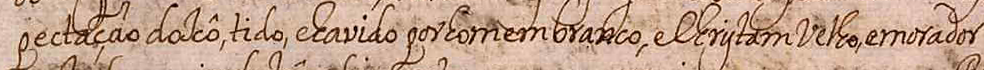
pectação do Icô, tido, e havido por homem branco, e Christam velho, e morador
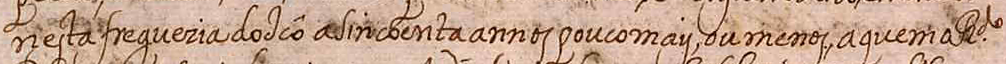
nesta freguezia do Icô a sincoenta annos pouco mais, ou menos, a quem o R.do
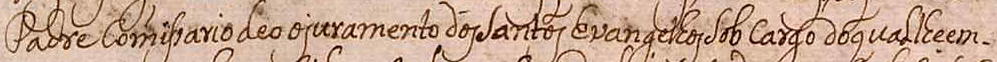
Padre Comissario deo o juramento dos Santos Evangelhos sob cargo do qual lhe em
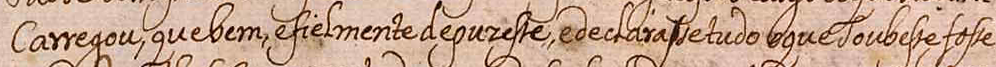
Carregou, que bem, e fielmente depuzesse, e declarasse tudo o que soubesse fosse
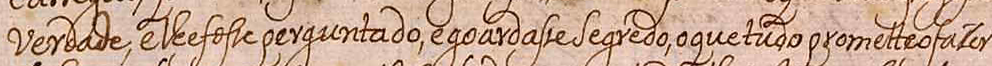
verdade, e lhe fosse perguntado, e goardasse segredo, o que tudo prometteo faZer
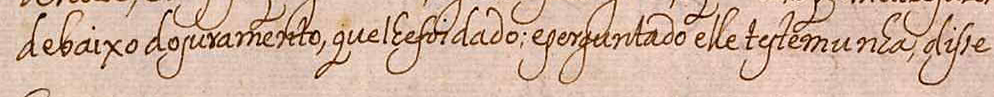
debaixo do juramento, que lhe foi dado; e perguntado elle testemunha, disse
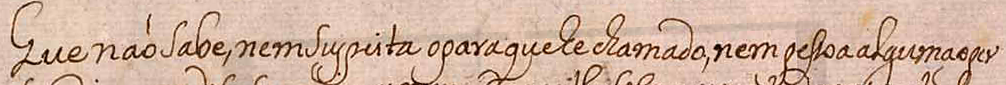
Que naõ sabe, nem suspeita o para que he chamado, nem pessoa alguma o per
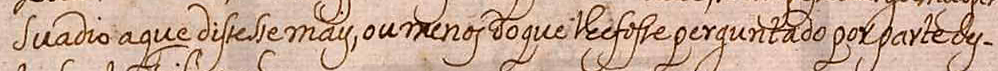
suadio a que dissesse mais, ou menos do que lhe fosse perguntado por parte des
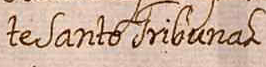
te Santo TribunaL
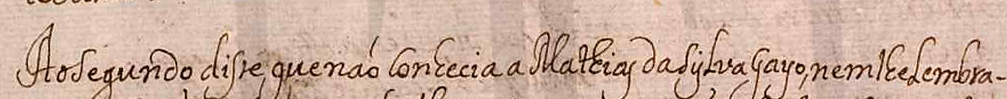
Ao segundo disse, que naõ conhecia a Mathias da Sylva Gayo, nem lhe Lembra
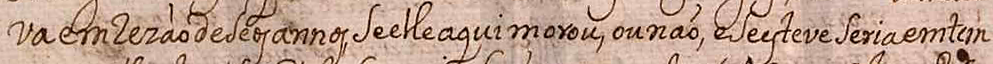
va em rezaõ de seos annos, se elle aqui morou, ou naõ, e e esteve seria em tem
